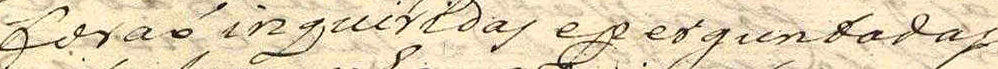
foraõ inquiridas e perguntadas
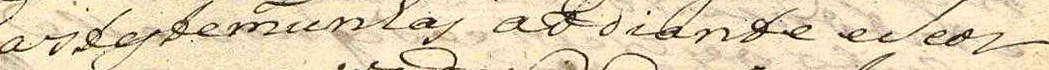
as testemunhas ao diante e Seos
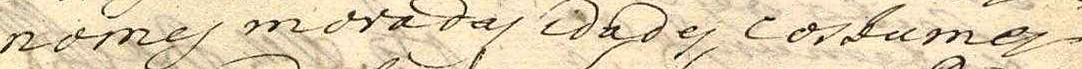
nomes moradas idades costumes
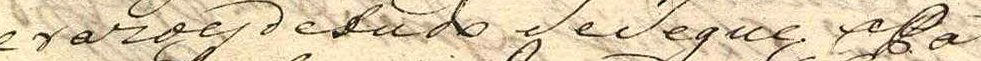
e razoes de tudo Se Segue o Pa
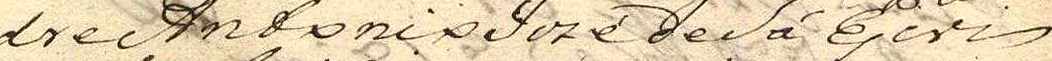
dre Antonio Iozé de Sá Escri
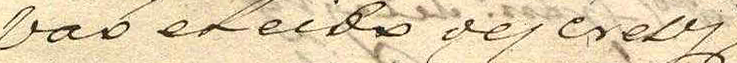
Vaõ eLeito o escrevj
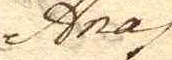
Anas
